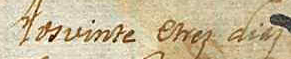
Aos uinte e trez diaz
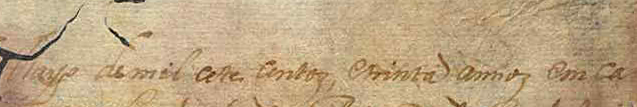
Mayo de mil cetecentos e trinta annos em ca
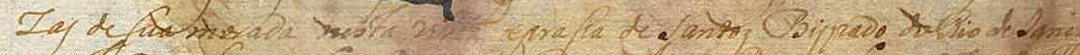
Zas de sua morada nesta vila e prassa de Santos Bispado do Rio de Ianei
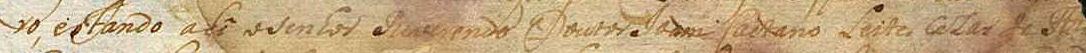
ro, estando ahi o senhor Reverendo Doutor Ioam Caetano Leite CeZar de Az
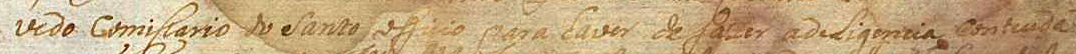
vedo Comissario do Santo officio para haver de fazer a deLigencia conteuda
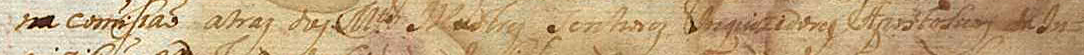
na com̄issaõ atras dos M.tos Illustres Senhores Inquizidores Apostolicos da In
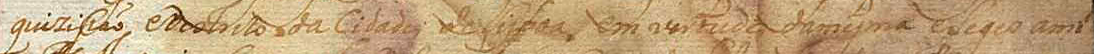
quizissaõ, e destrito da Cidade de Lisboa, em vertude da mesma eLegeo a mī
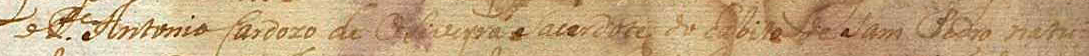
o P.e Antonio Cardozo de Oliveyra Sacerdote do habito de Sam Pedro natu
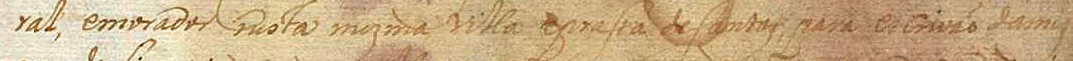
ral, e morador nesta mesma Villa e prassa de santos, para escrivaõ da mes
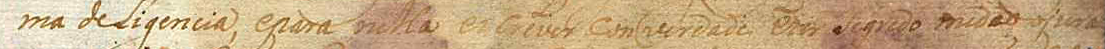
ma deLigencia, e para nella escrever com verdade e ter segredo me deo o jura
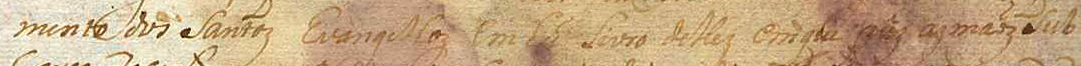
mento dos Santos Evangelhos em hū Livro delles em que pûs as maõs sub
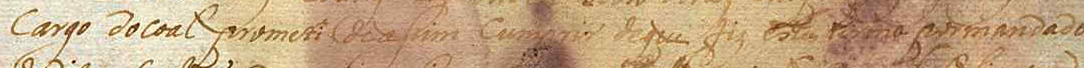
Cargo do coal prometi de assim cumprir de que fiz este termo por mandado
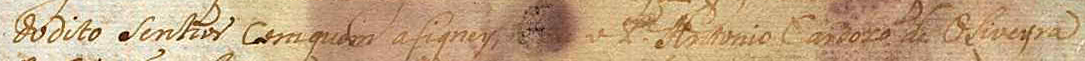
do dito Senhor com quem asigney, u o P. Antonio Cardozo de Oliveyra
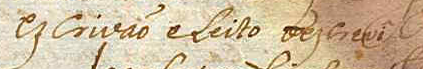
esCrivaõ eLeito o escrevi
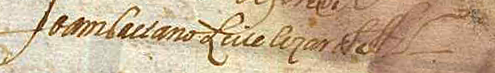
Joam Caetano Leite Cezar d̄ Az.o
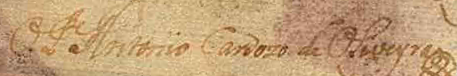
O P.e Antonio Cardozo de Oliveyra
